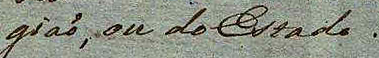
giaõ, ou do Estado?
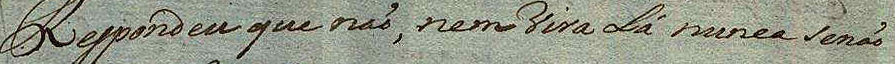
Respondeu que naõ, nem Vira Lá nunca senão
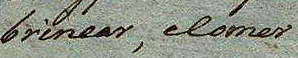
brincar, e comer.
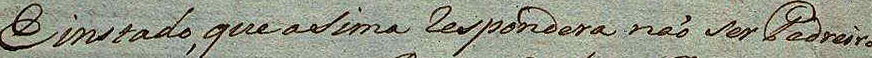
E instado, que asima respondera naõ ser Pedreiro
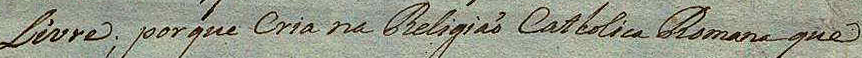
Livre; porque cria na Religiaõ Catholica Romana que
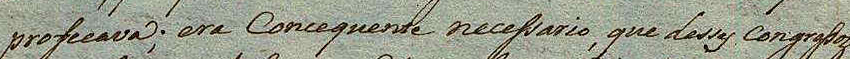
profecava; era concequente necessario, que desses congressos
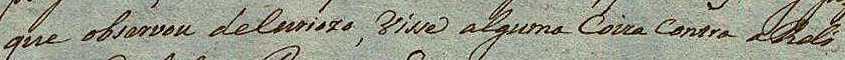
que observou de Curiozo, visse alguma Coiza contra a Reli
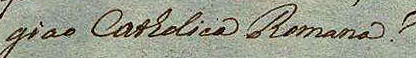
giao Catholica Romana?
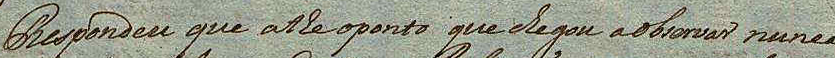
Respondeu que athe o ponto que chegou a observar nunca
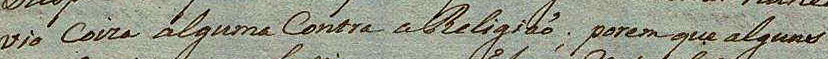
vio coiza alguma contra a Religiaõ; porem que alguns
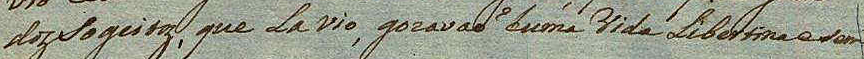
doz sogeitoz, que La vio, gozavaõ huma Vida Libertina e sem
